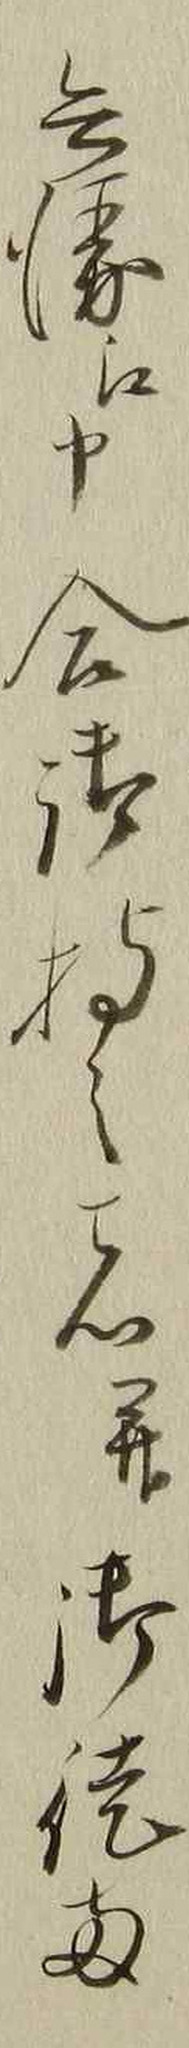兵衛江申合御持之者并御徒両
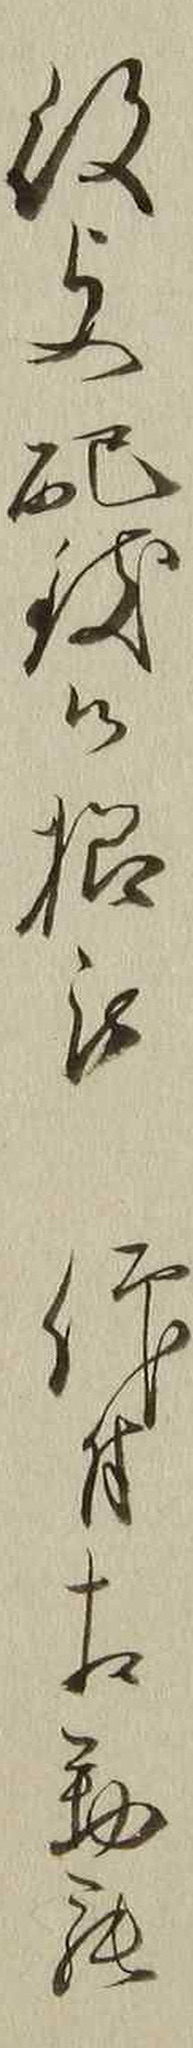役支配致候様被仰付相勤罷
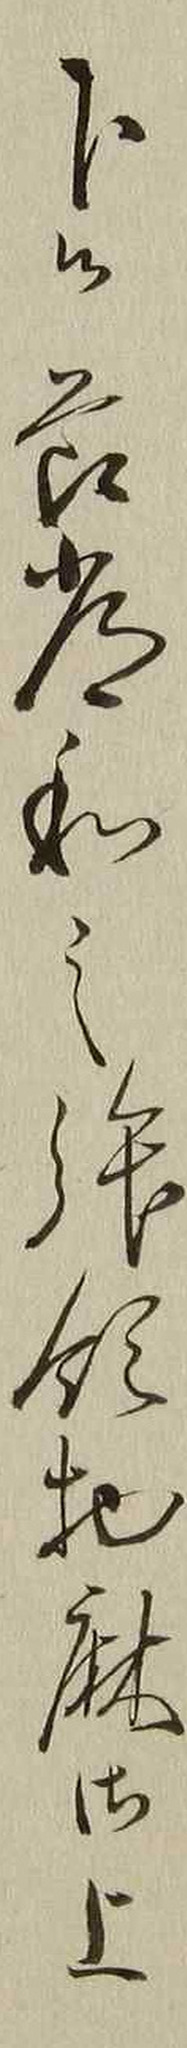下候節常和之拝領物麻御上
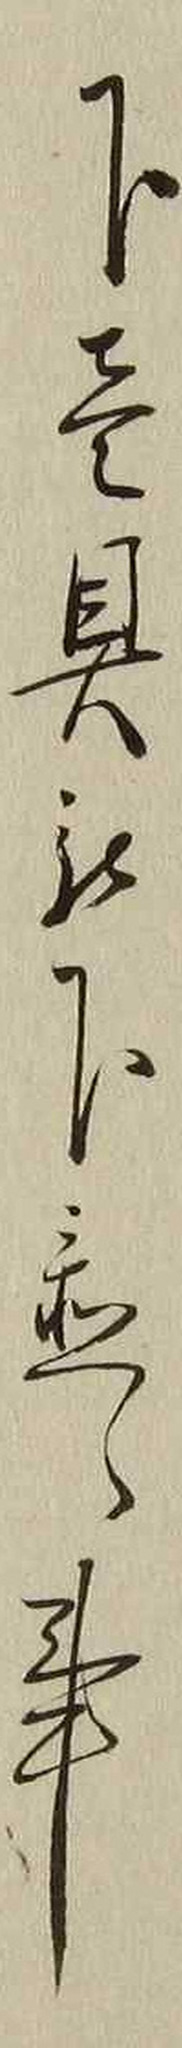下壱具被下置候事
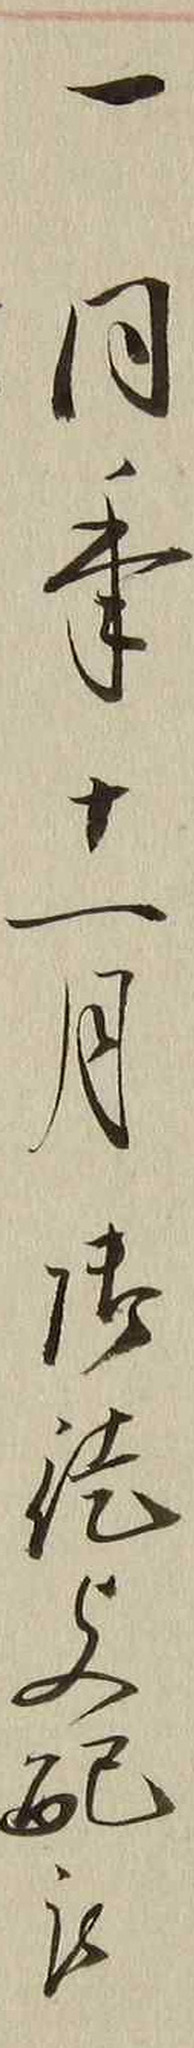一同年十一月御徒支配被
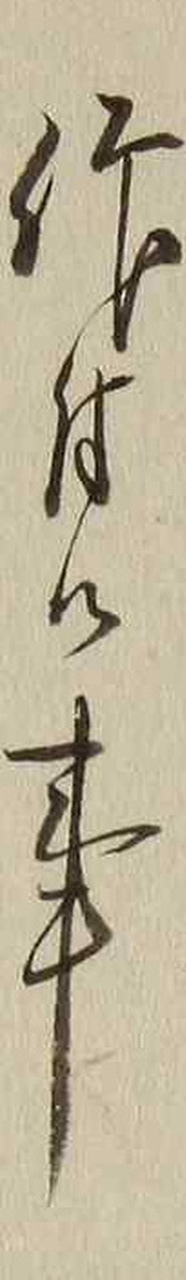仰付候事
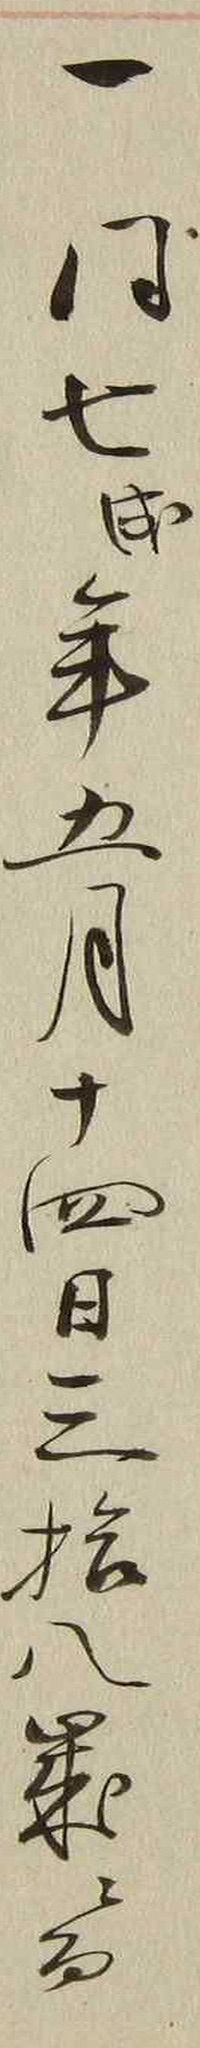一同七戌年五月十四日三拾八歳に而
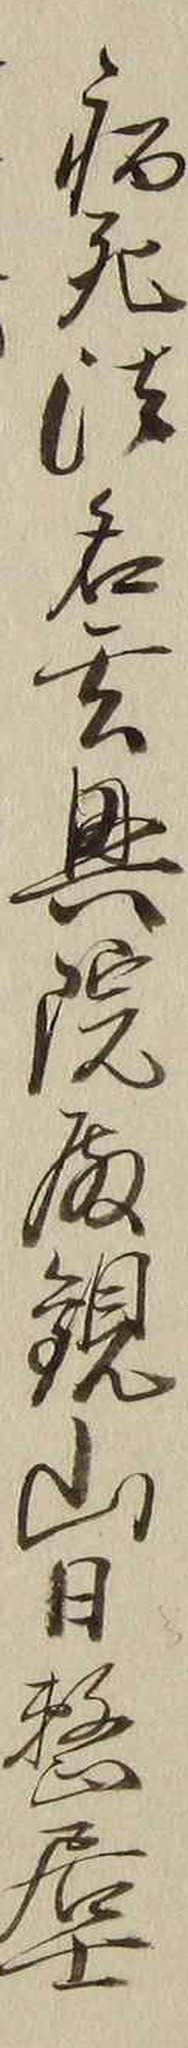病死法名玄興院殿観山日整居士
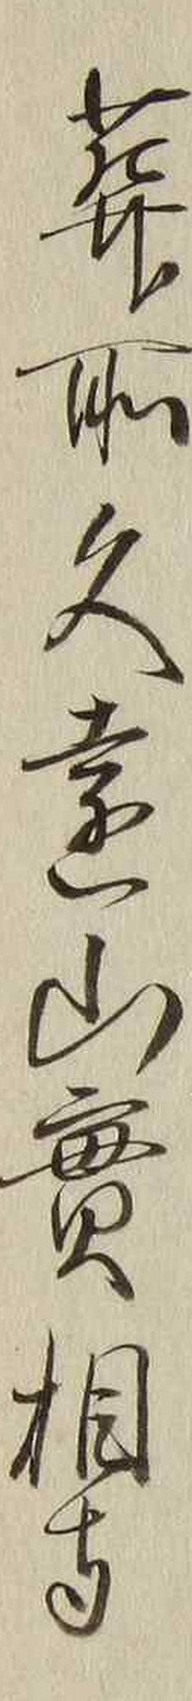葬所久遠山実相寺
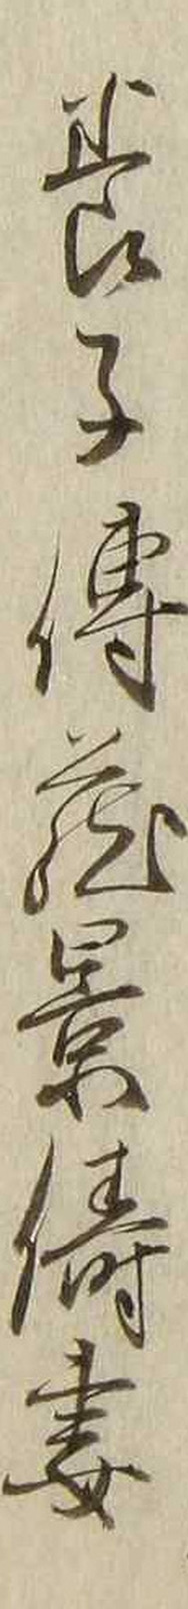養子伝蔵景儔妻
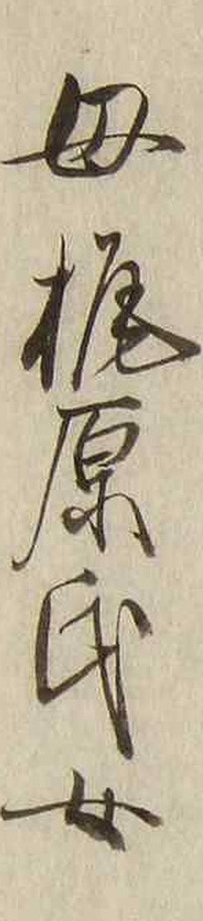母梶原氏女

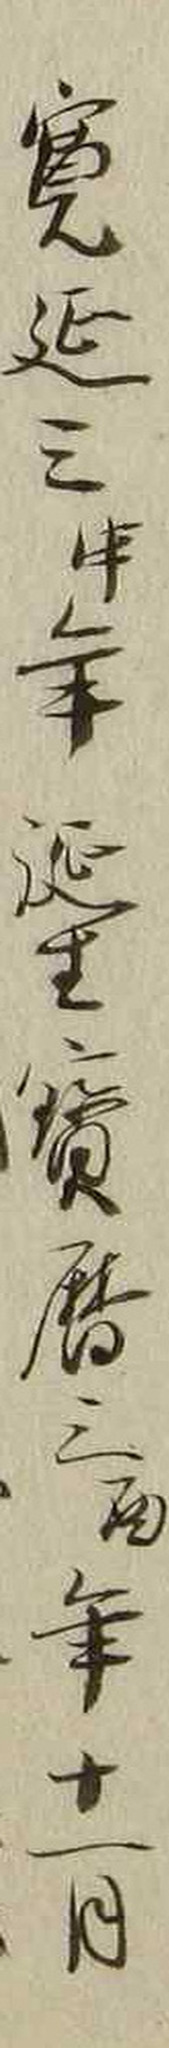寛延三申年誕生宝暦三酉年十一月
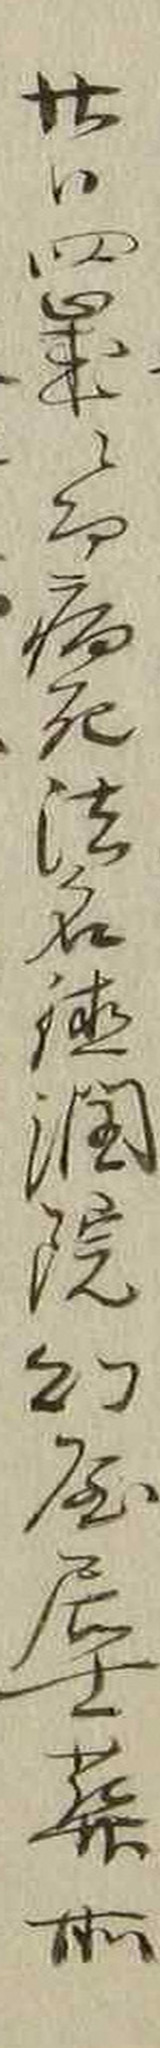門太郎廿日四歳に而病死法名徳潤院幻屋居士葬所
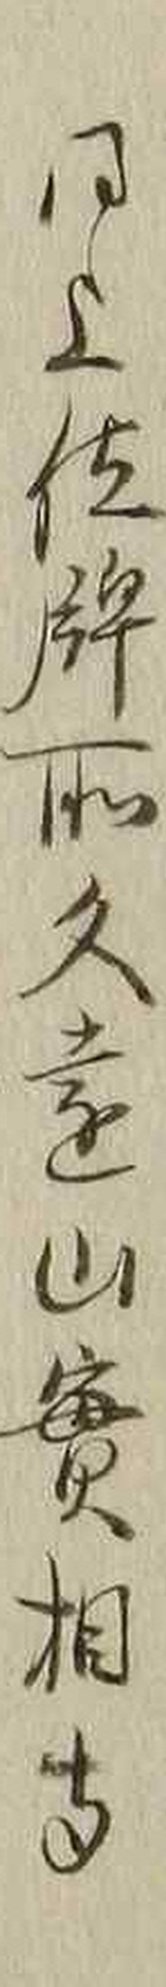同上位牌所久遠山実相寺
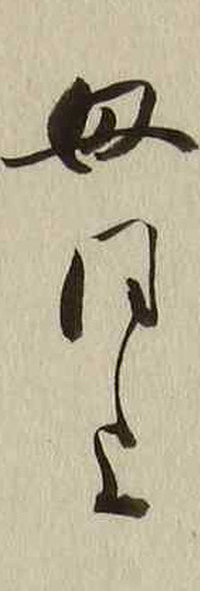母同上
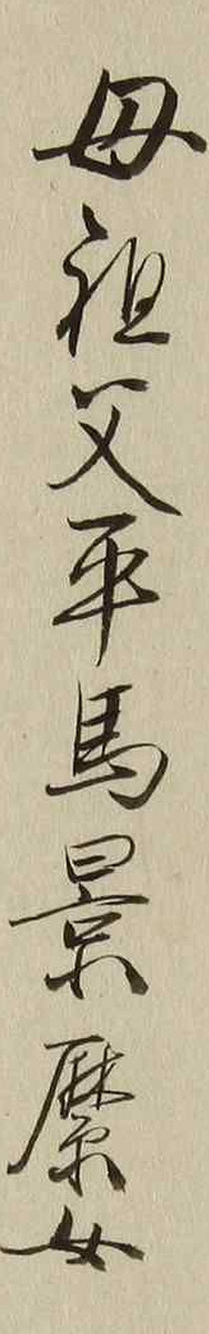母祖父平馬景縻女
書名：諸士系譜　巻之103　か之部11
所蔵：会津若松市立会津図書館
